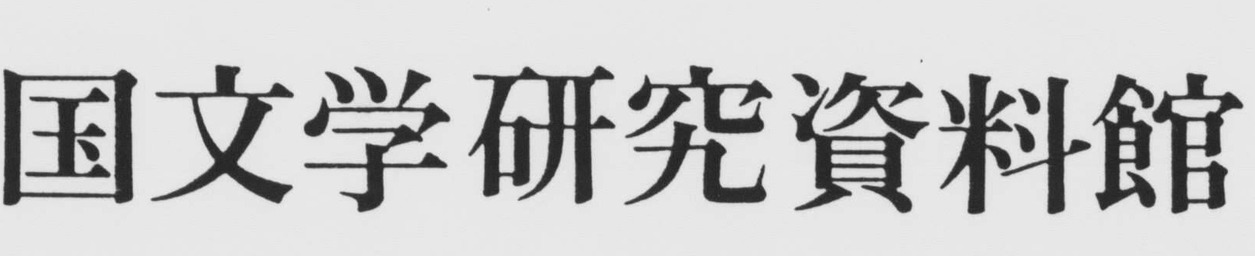国文学研究資料館

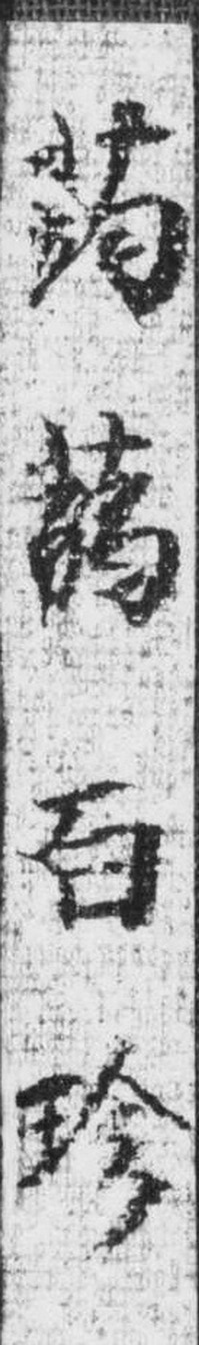蒟蒻百珍
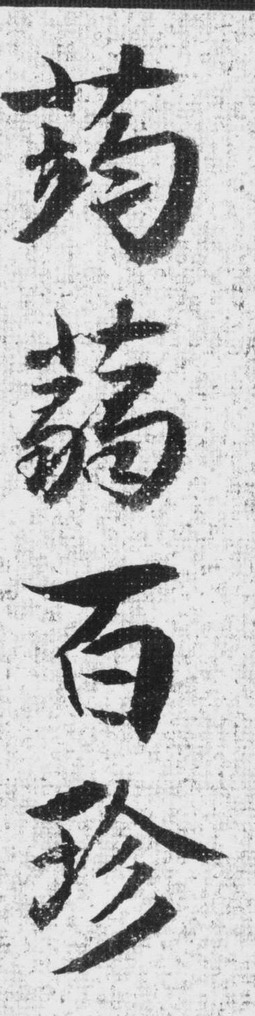蒟蒻百珍

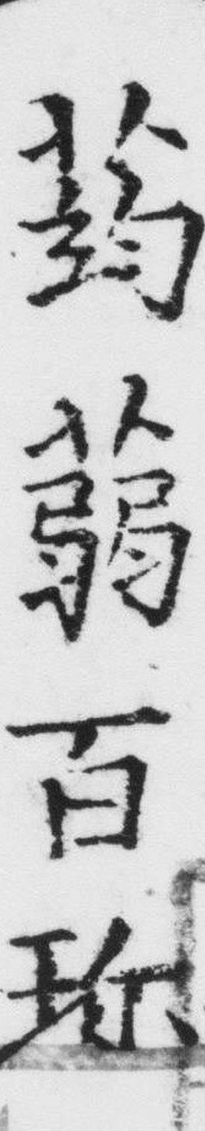蒟蒻百珍
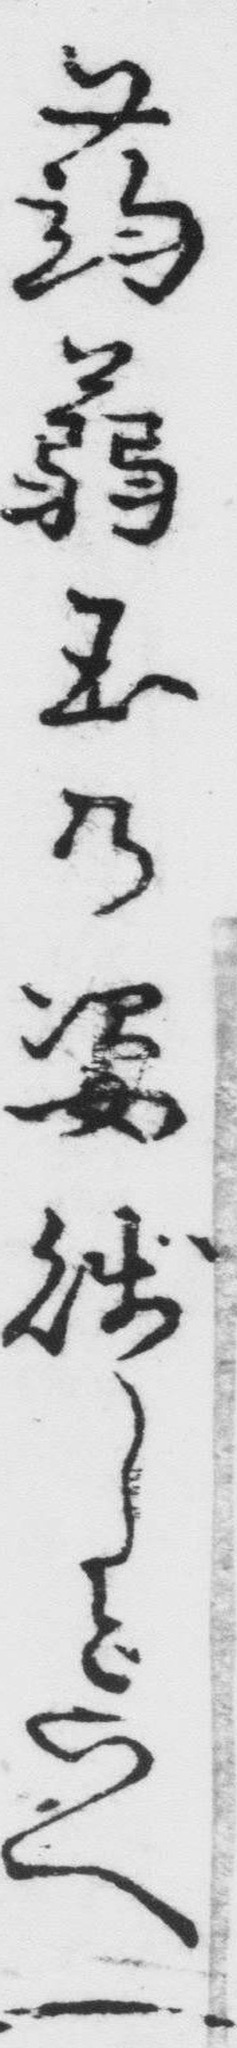蒟蒻玉の姿賤しといへ
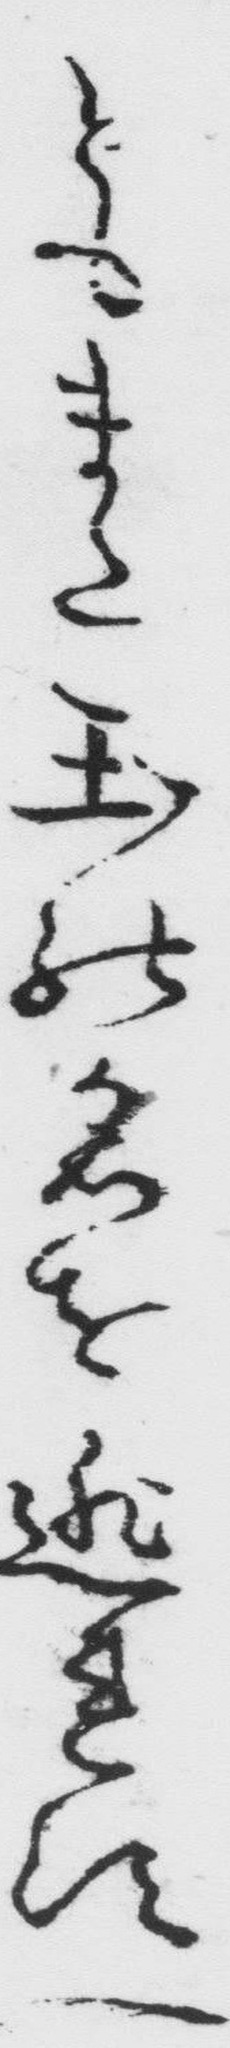ともまた玉の名を逃れす
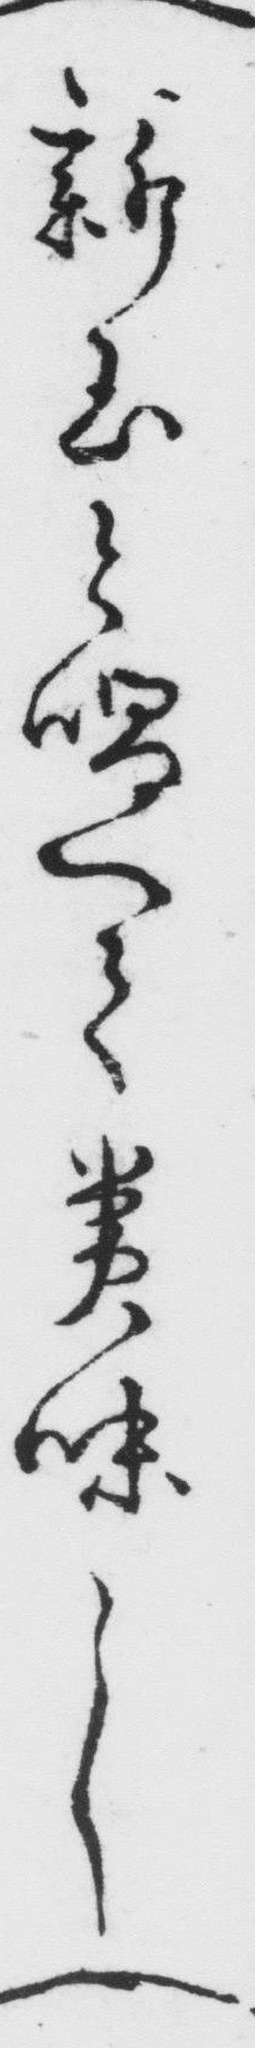新玉と唱へて賞味し
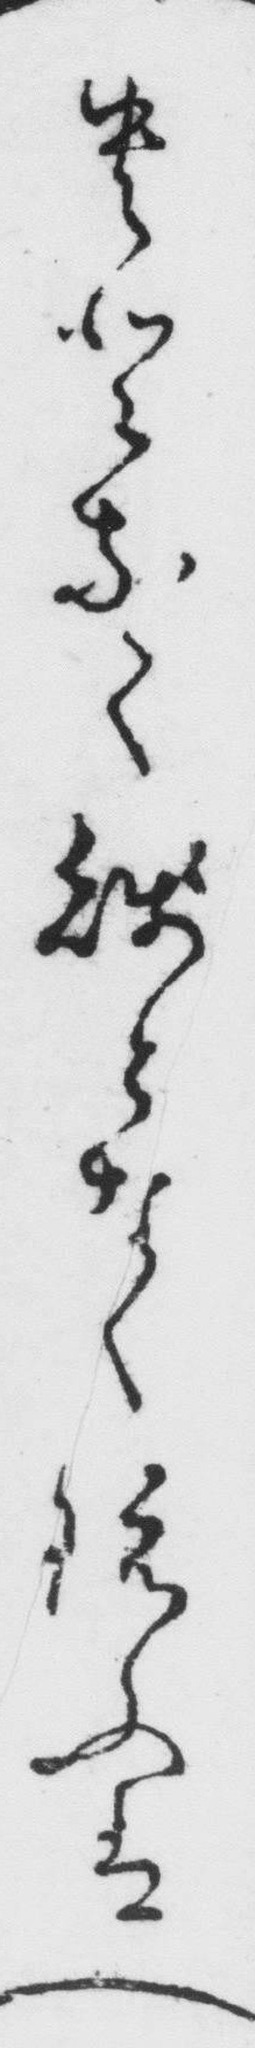貴となく賤となく珍ふは

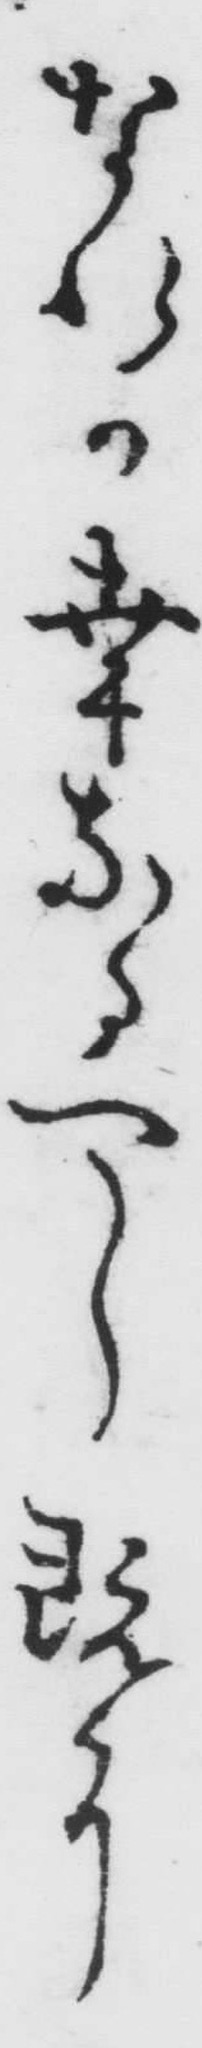なれか幸なるへし既に
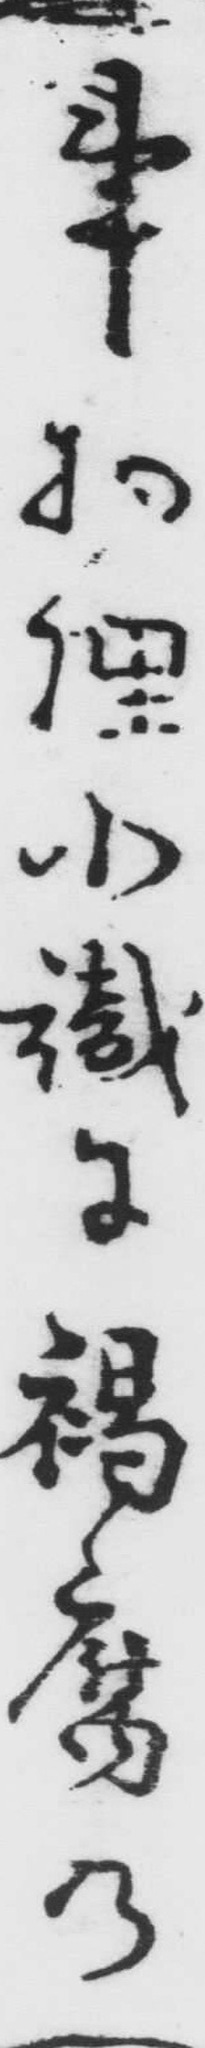事物理小識に褐腐の
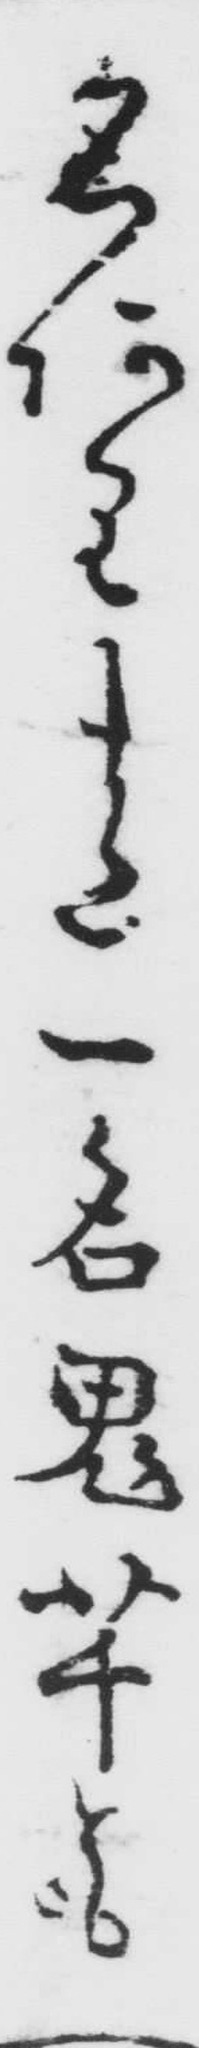名ありまた一名鬼芋とも
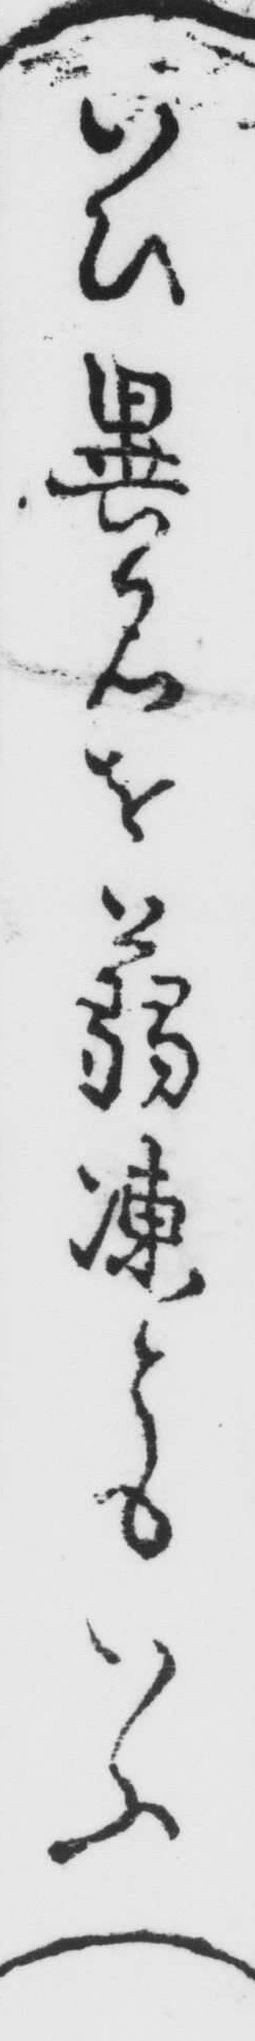いひ異名を蒻凍ともいふ
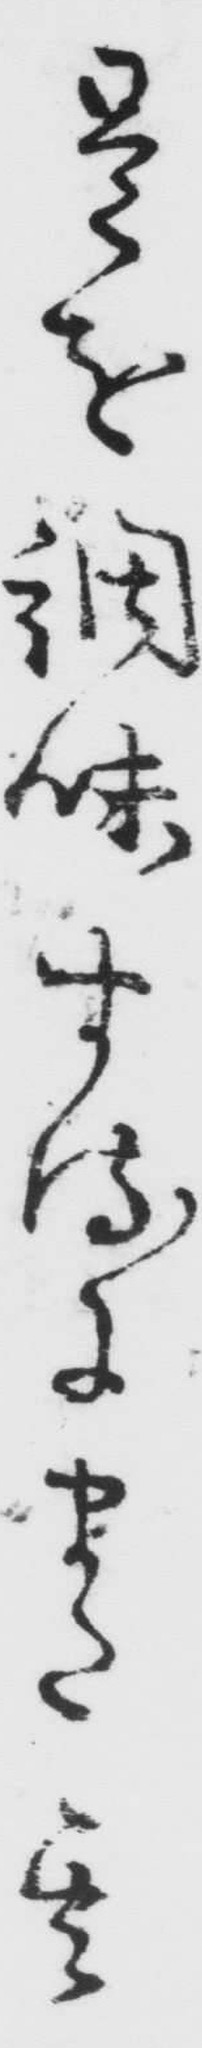是を調味するにまた其
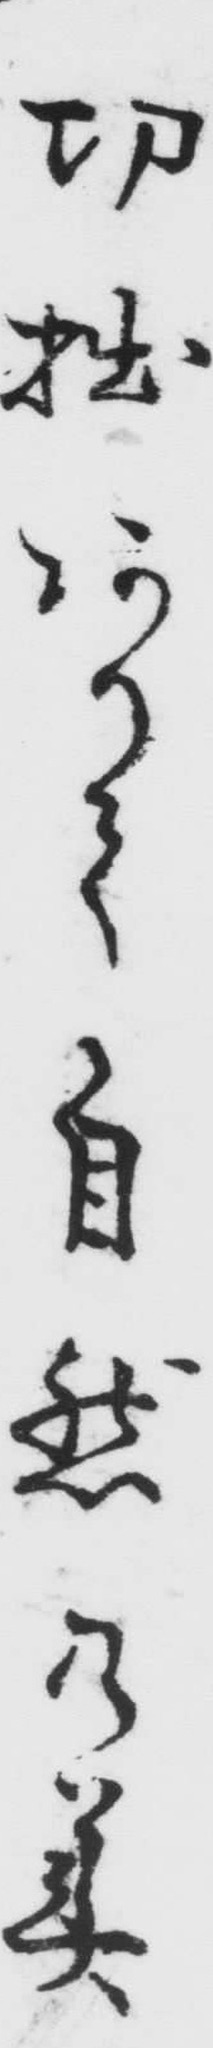功拙ありて自然の美
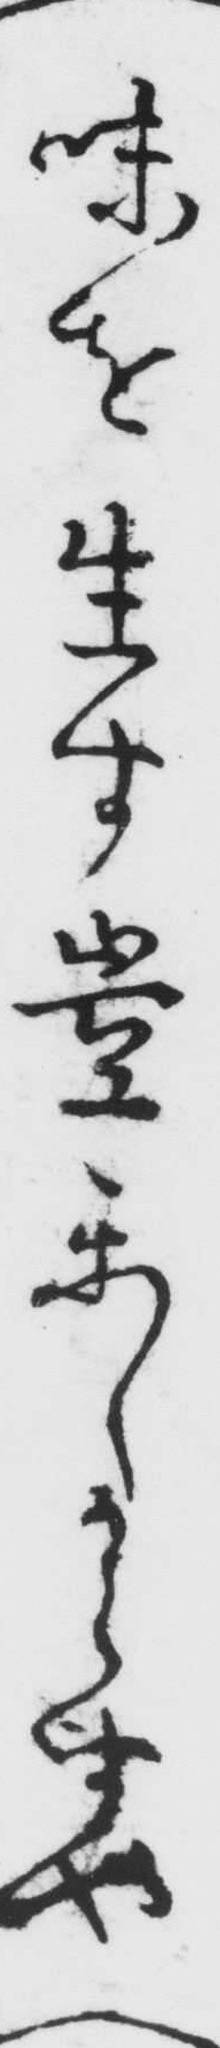味を生す豈楽しからすや
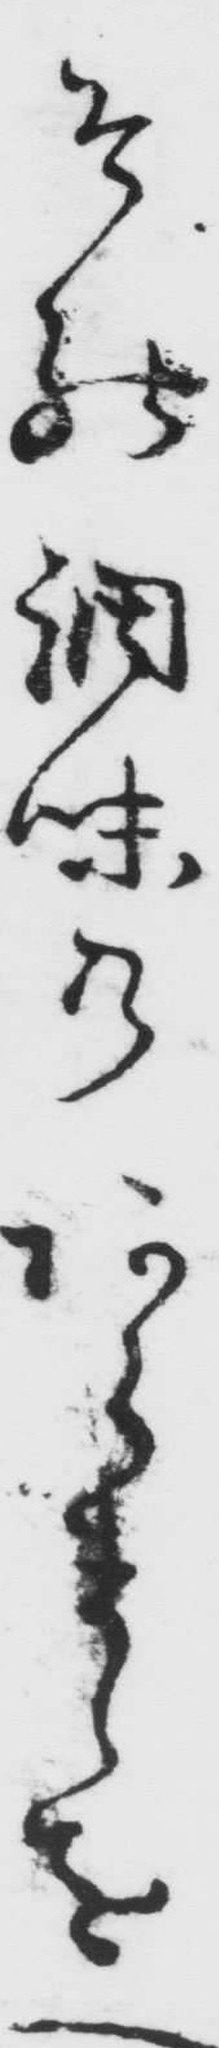その調味のあらましを
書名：蒟蒻百珍
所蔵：大阪府立大学学術情報センター 国文学研究資料館
